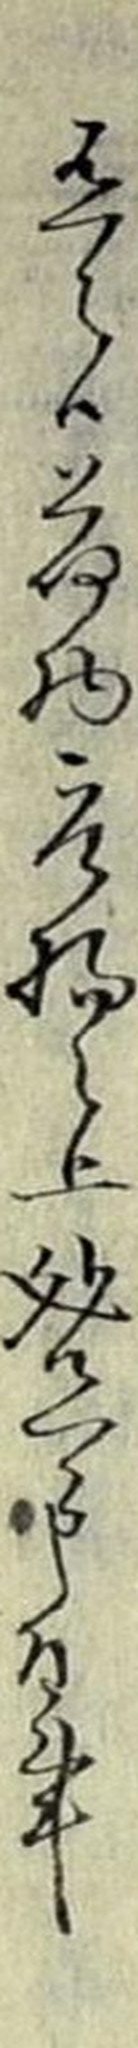有之は荷物取揚之上咎可申付事
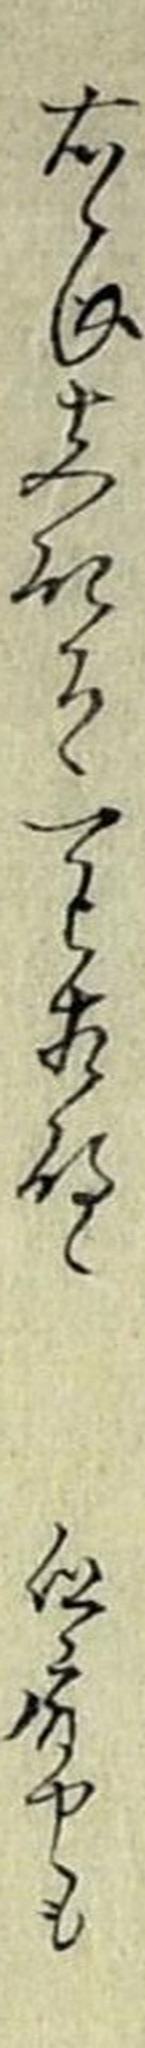右之趣支配下へ可被相触候但府中へも
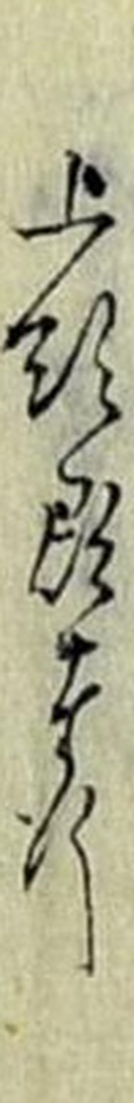上領郡奉行
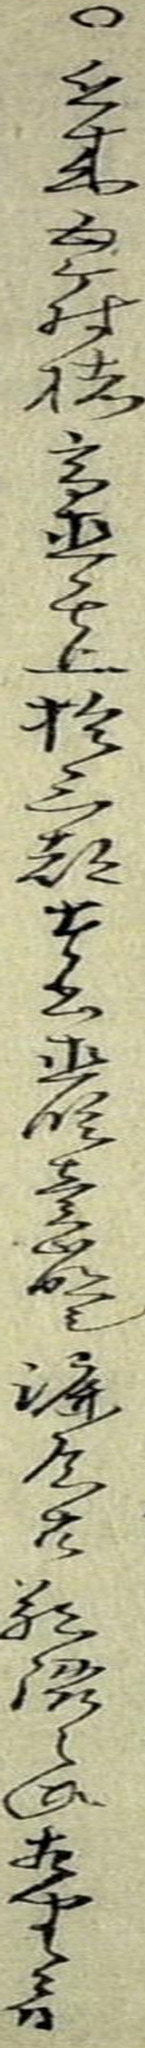〇近来五ケ村楮高直其上於三都奉書直段売崩し漉屋共難渋之趣相聞候に付
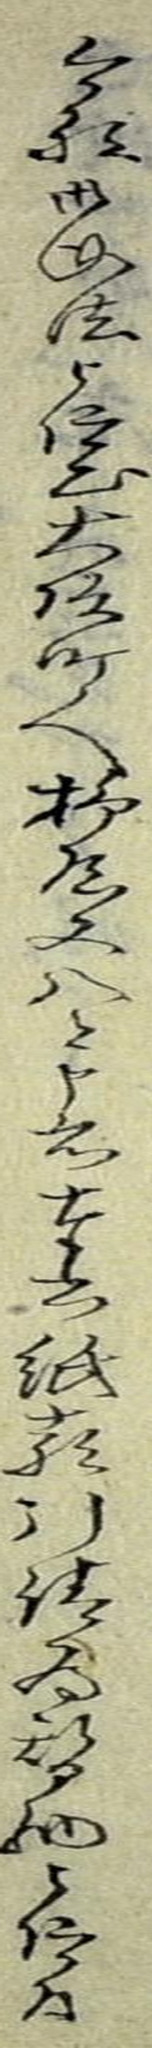今般御趣法被仰出大坂町人柳屋又八と申者奉書紙類引請為替納被仰付
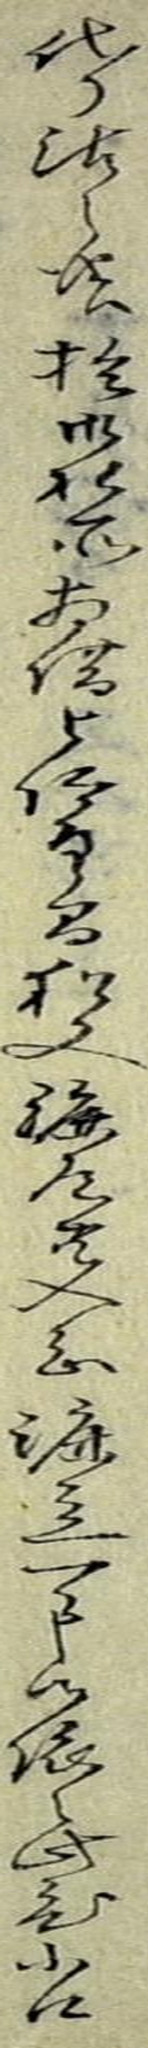代り銀之儀は於御札所拝借被仰付候間猶又漉屋共入念漉立可申候依之此度小口
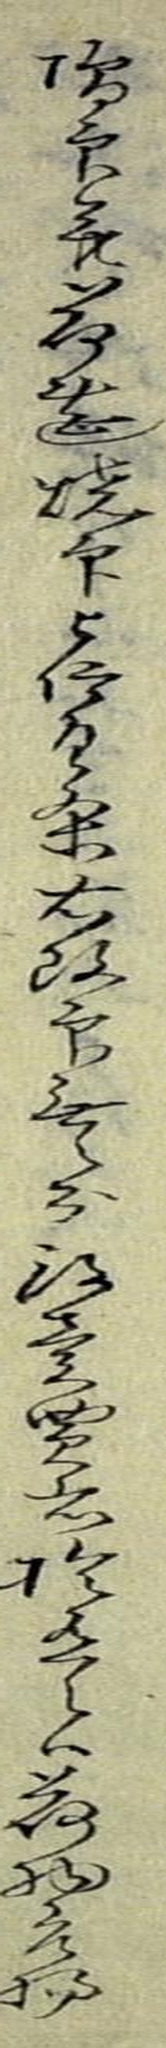増印并荷莚焼印被仰付候条右改印無之分致売買者於有之は荷物取揚
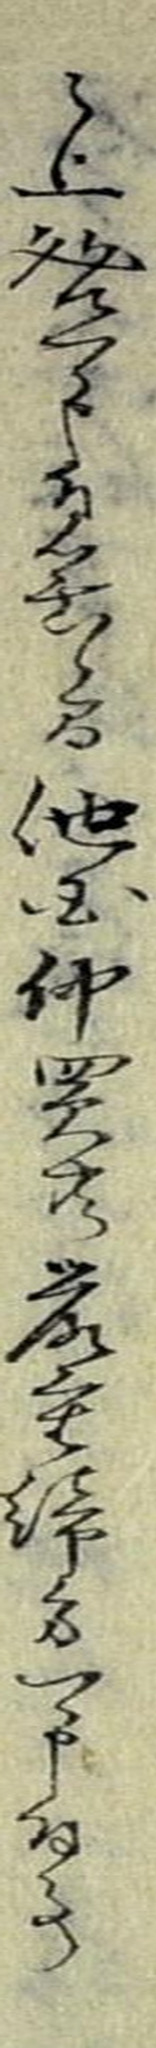之上咎可申付筈候間他国仲買共厳重締方可申付事
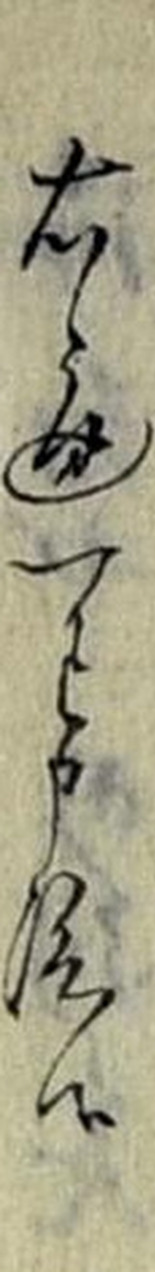右之通可被申渡候
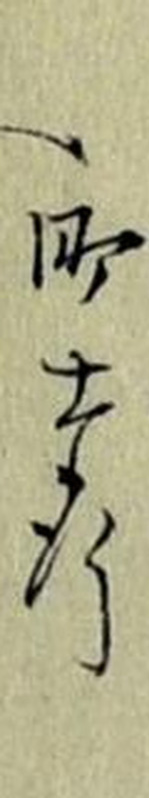町奉行
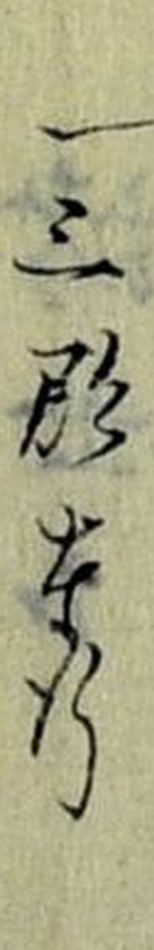三郡奉行
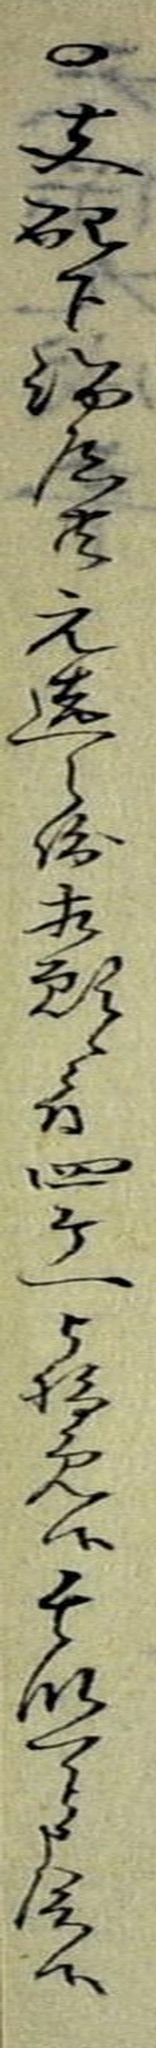〇支配下酒屋共元造之儀相願候に付四ヶ一被指免候其段可被申渡候
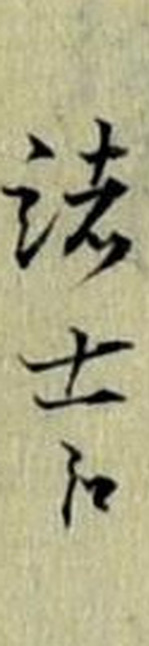諸士え
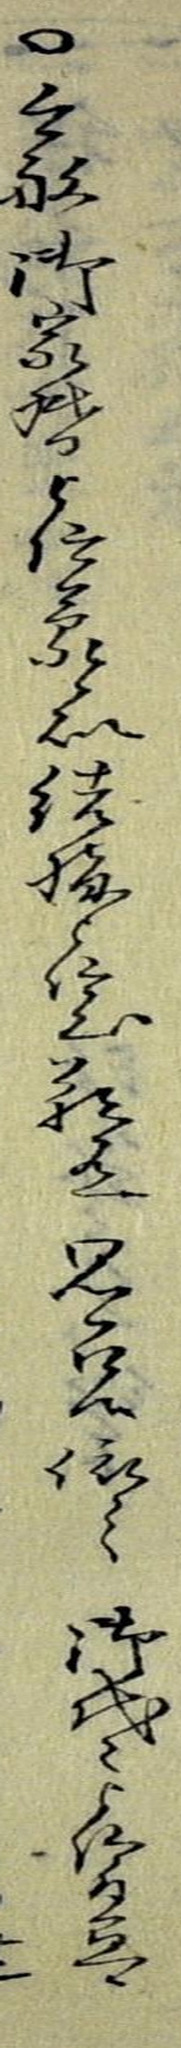〇今般御家督被仰蒙候処結構被仰出難有思召候依之御代々被仰付置候
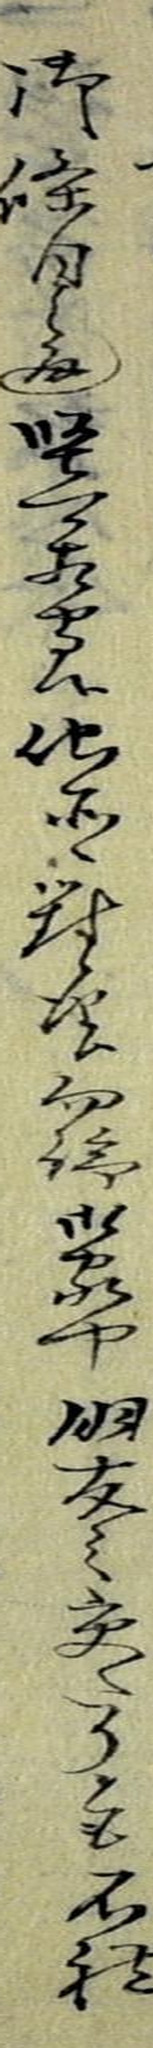御条目之通堅可相守候他所へ対候儀は勿論御家中朋友之交たりとも不礼
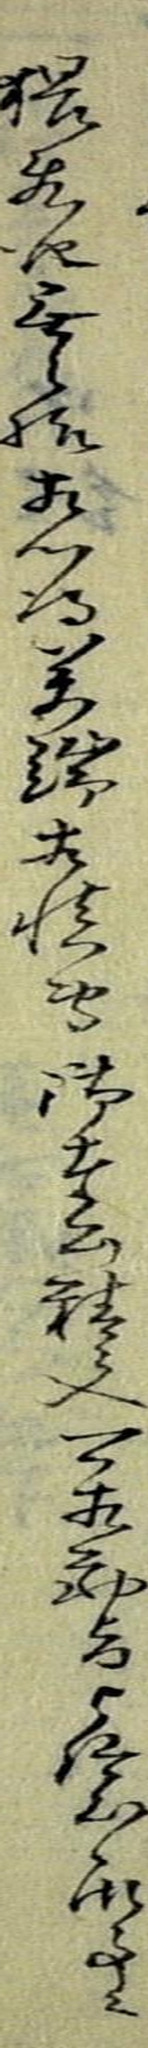猥敷儀無之様相心得万端相慎専御奉公精ニ入可相勤旨被仰出候御事に
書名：命令之部 六
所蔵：福井県文書館 Fukui Prefectural Archives
